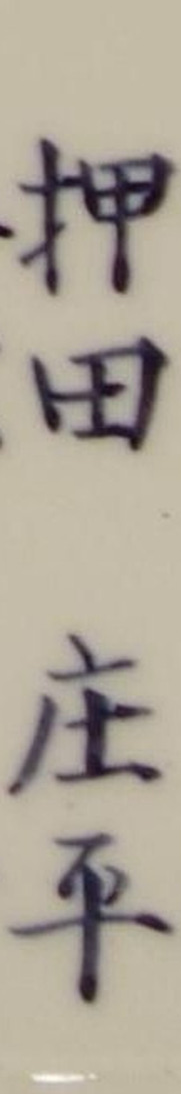押田庄平
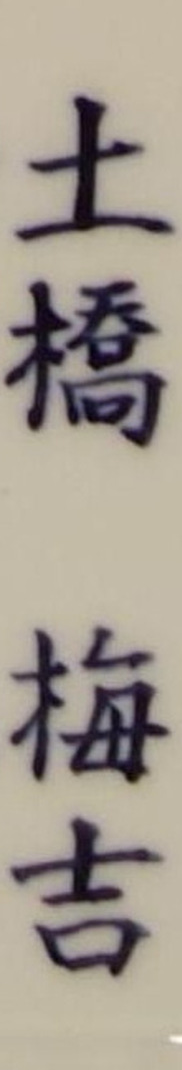土橋梅吉
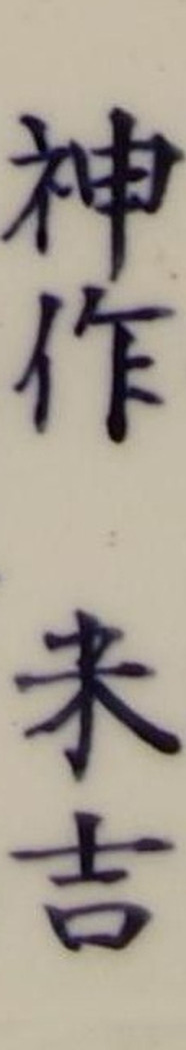神作未吉
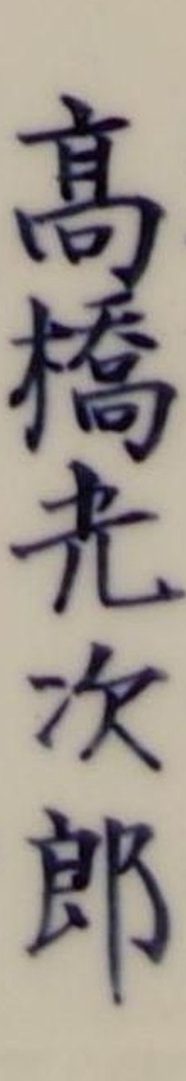高橋光次郎
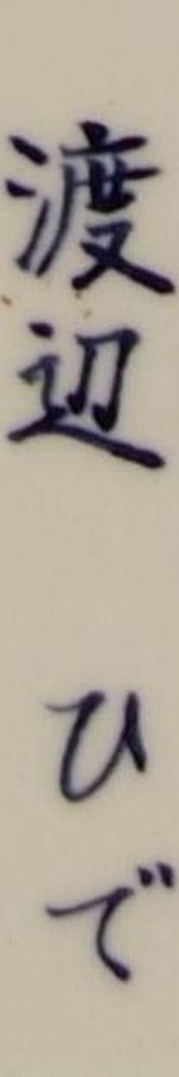渡辺ひで
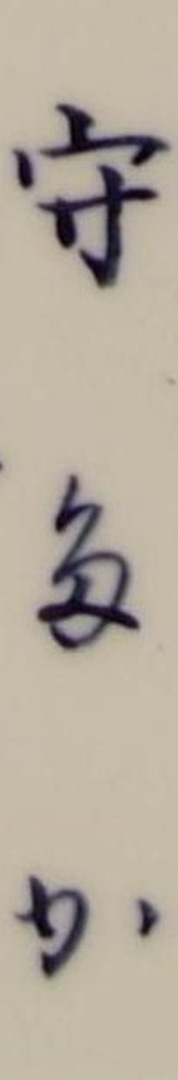守たか
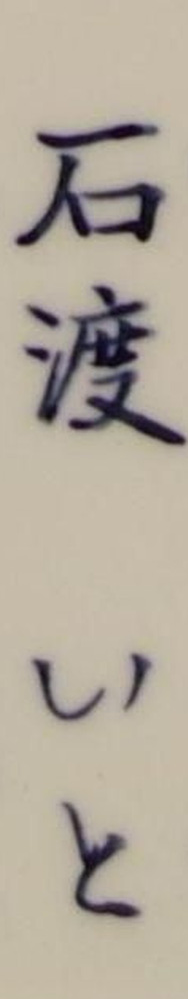石渡いと
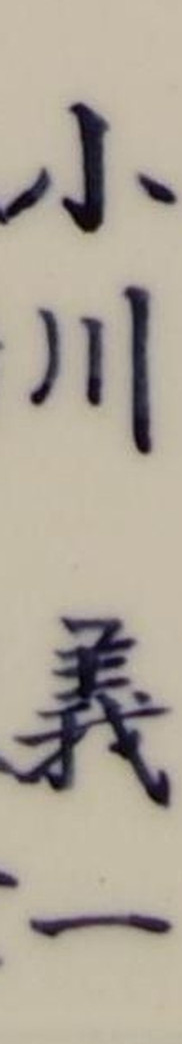小川義一
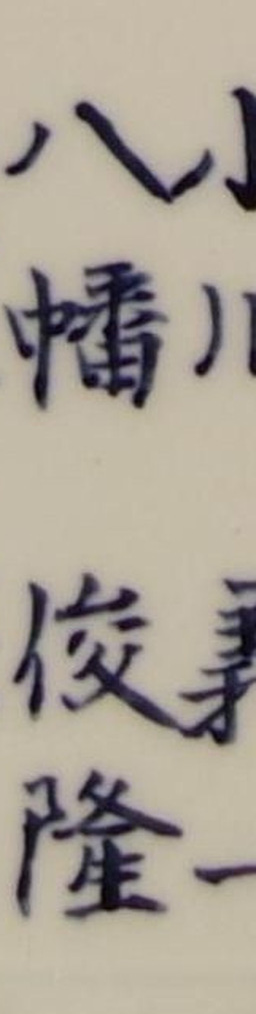八幡俊隆
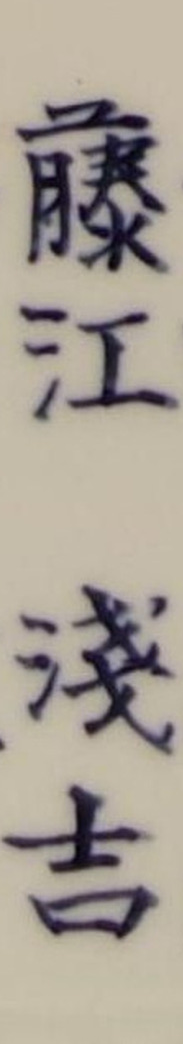藤江浅吉
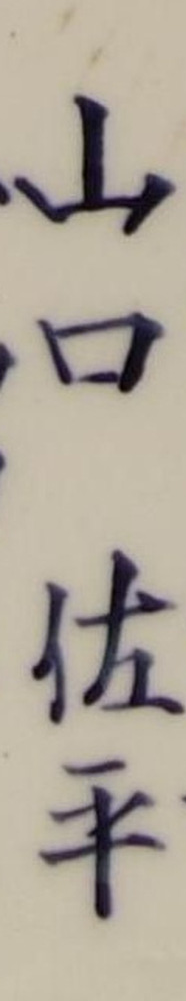山口佐平
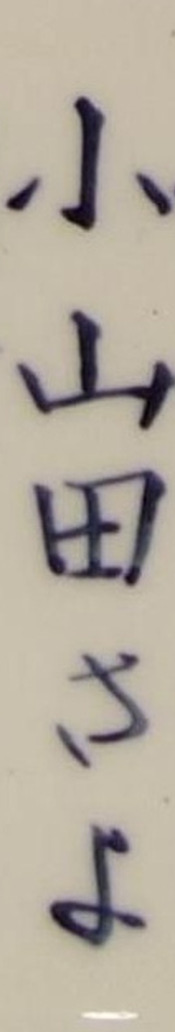小山田さよ
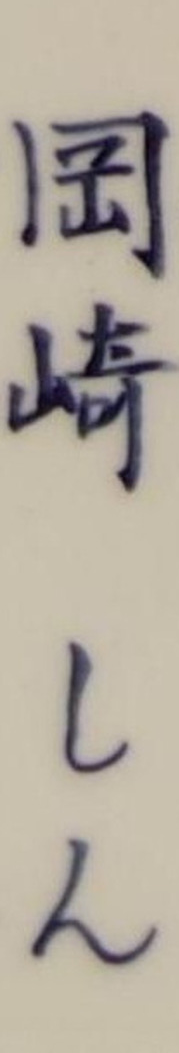岡崎しん
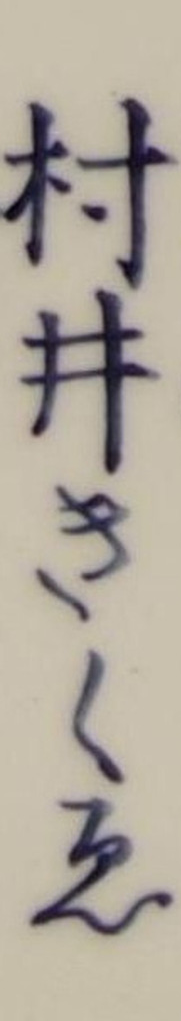村井きくゑ
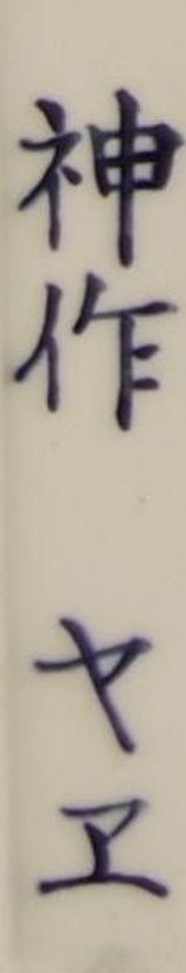神作ヤヱ

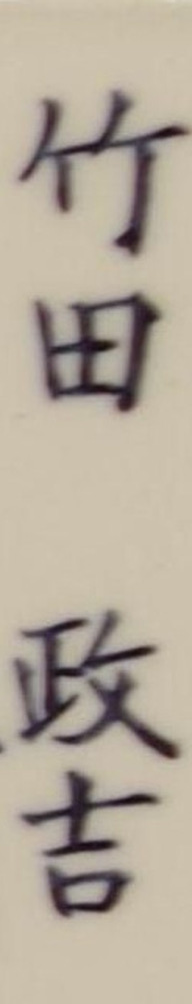竹田政吉
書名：E~L
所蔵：高野山金剛峯寺
